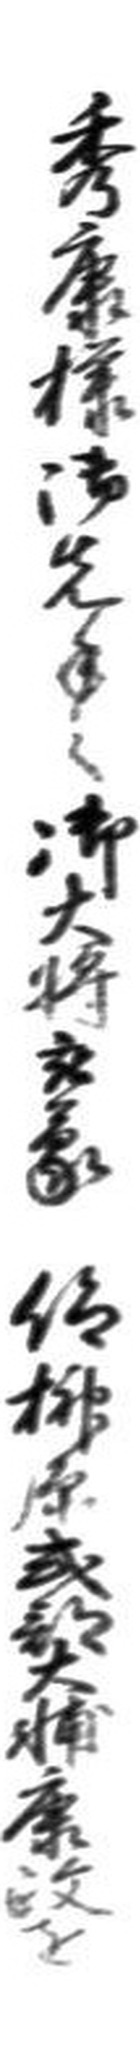秀康様御先手之御大将被蒙仰榊原式部大輔康政を
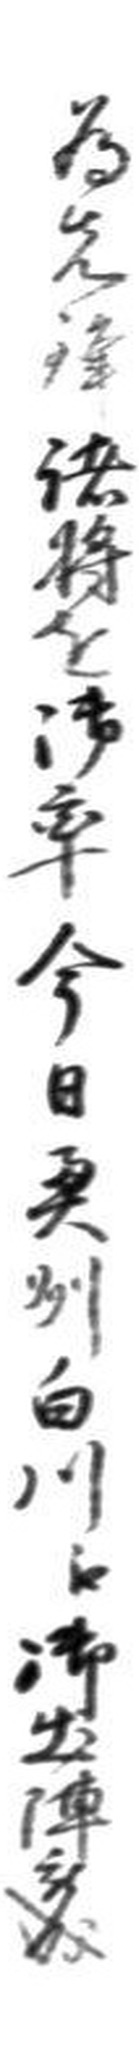為先鋒諸将を御率今日奥州白川江御出陣被成
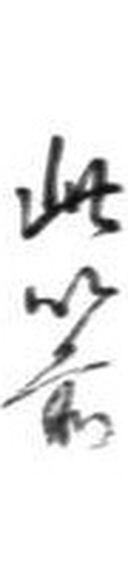此以前
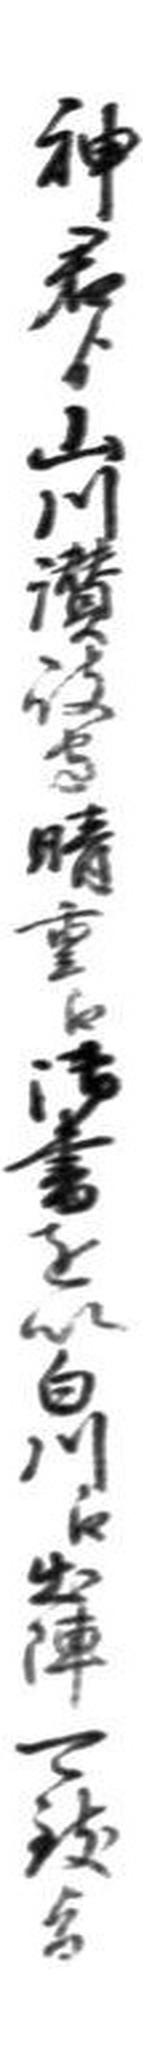神君ゟ山川讃岐守晴重江御書を以白川江出陣可致旨

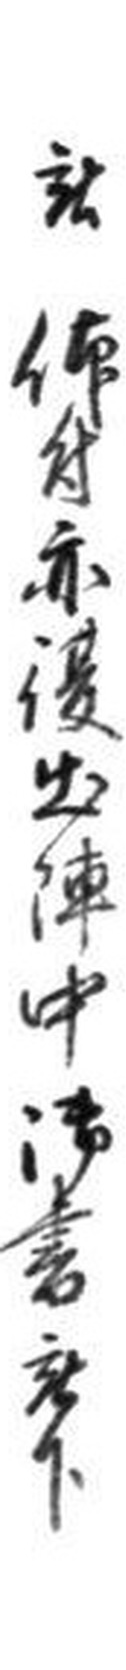被仰付亦復出陣中御書被下
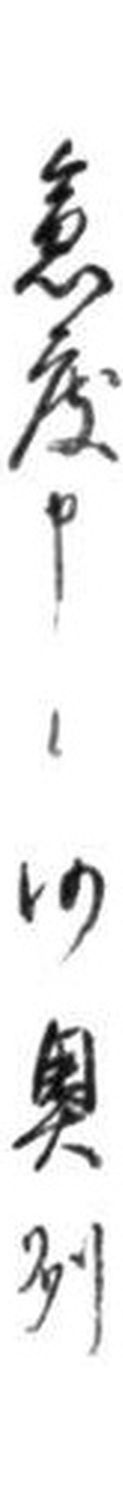急度申候仍奥州
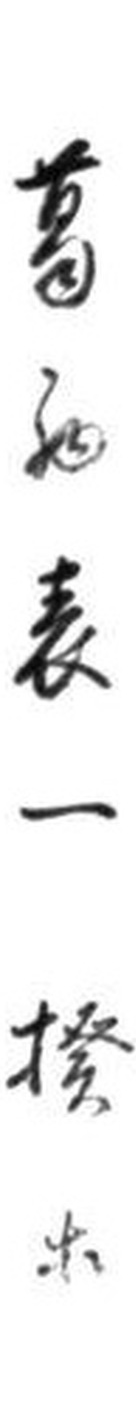葛西表一揆等
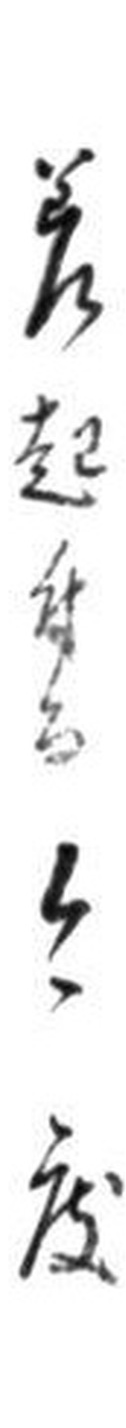差起付而今度
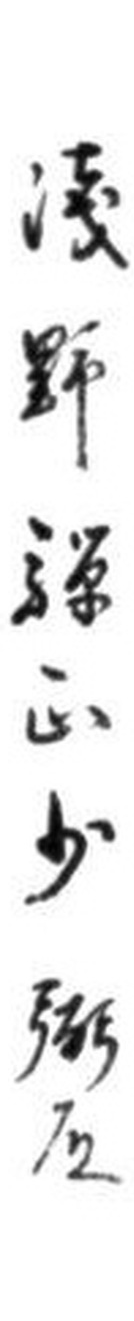浅野弾正少弼殿
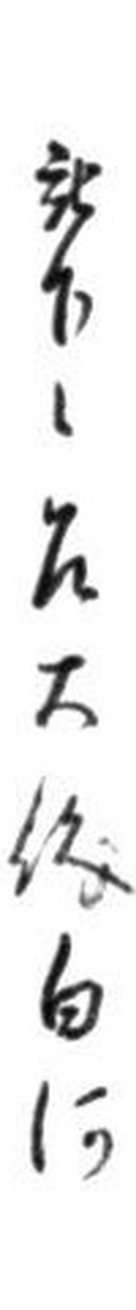被下候乍大儀白河
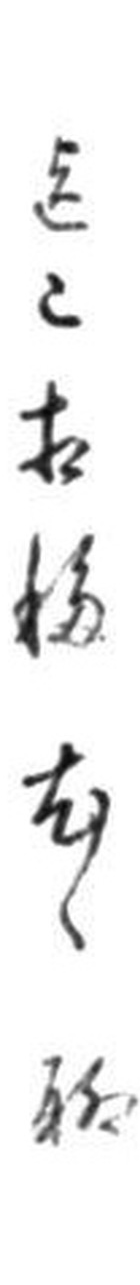迄被相移尤候聊
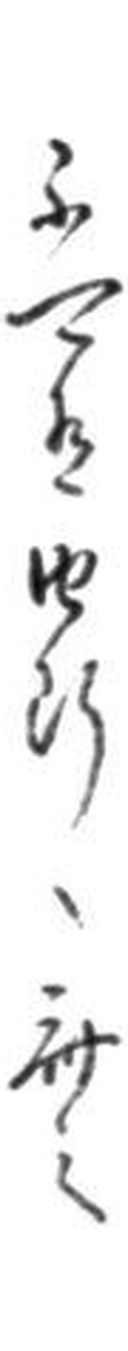不可有由断候謹言
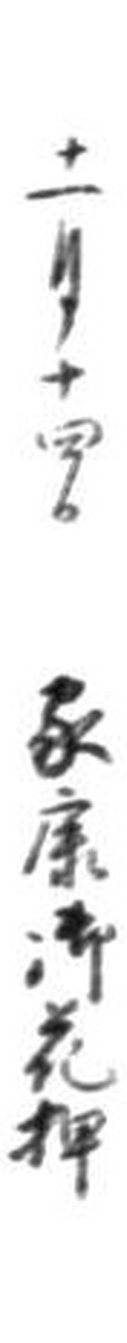十一月十四日家康御花押
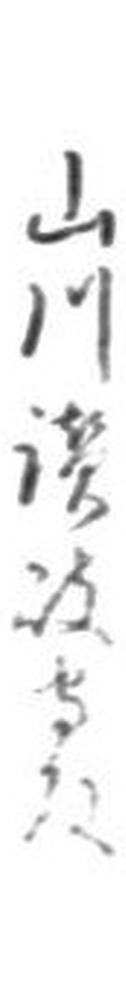山川讃岐守殿
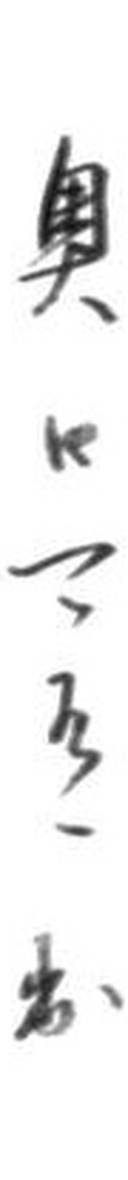奥口可有出
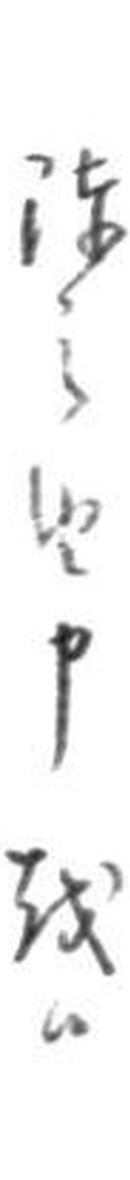陣之由申越候
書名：家譜 一 秀康公 従天正二年到慶長十二年
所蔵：福井県文書館 Fukui Prefectural Archives
